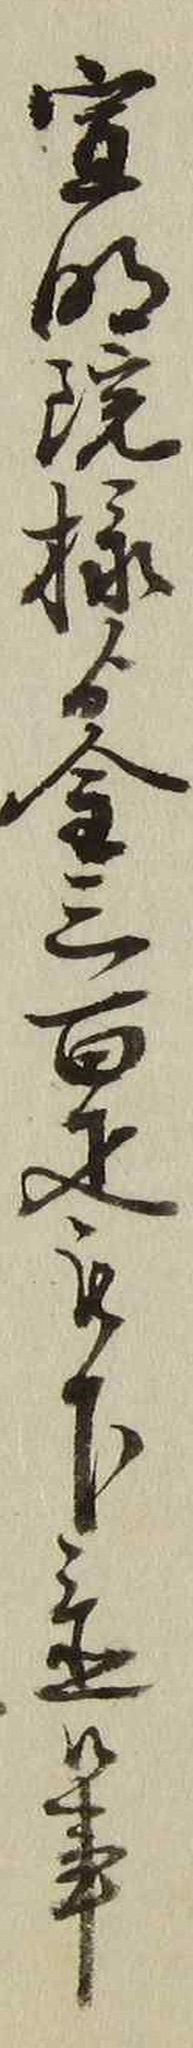宣明院様ゟ金三百疋被下置候事
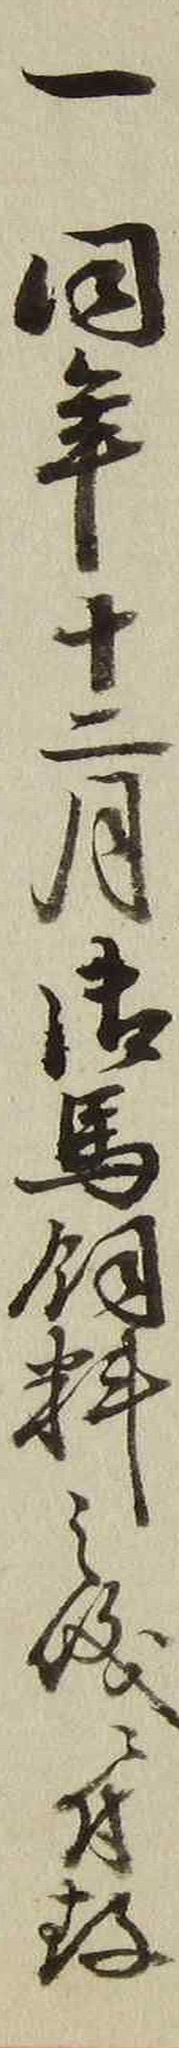一同年十二月御馬飼料之儀ニ付存
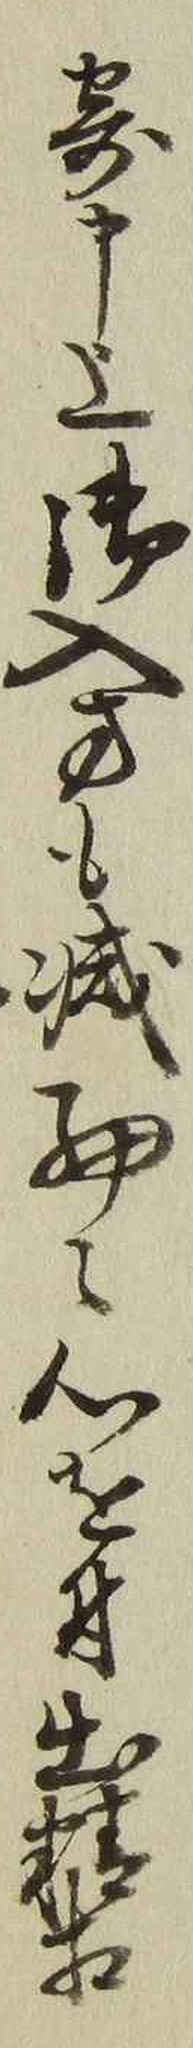寄申上御入方も減細々心を付出精相
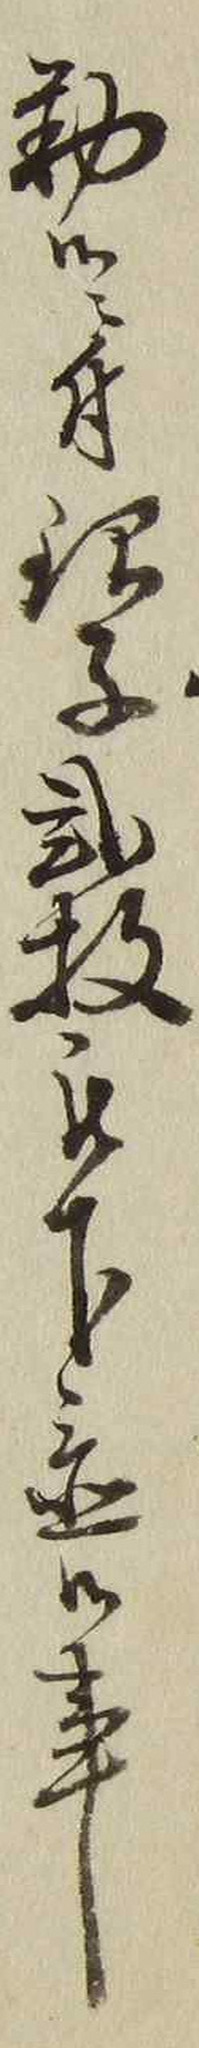勤候ニ付銀子弐枚被下置候事
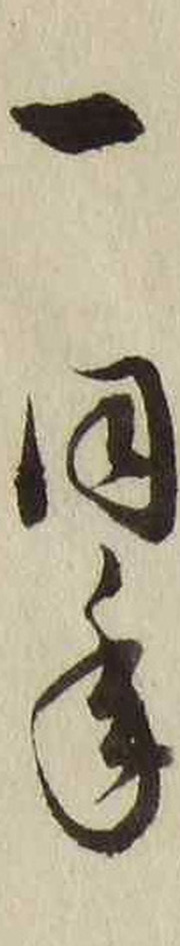一同年

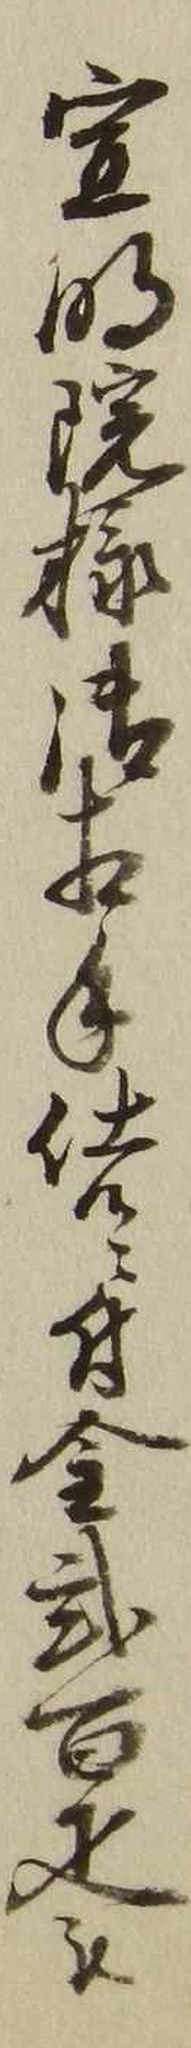宣明院様御相手仕候ニ付金弐百疋被
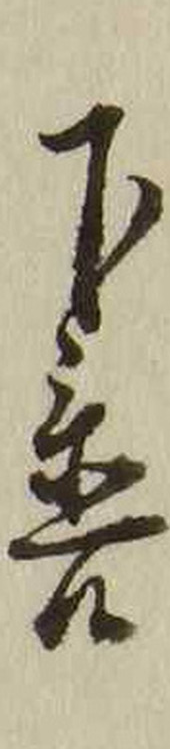下置候
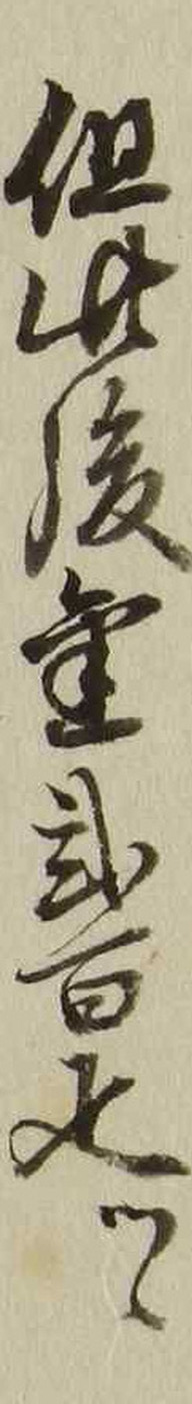但此後金弐百疋ツヽ
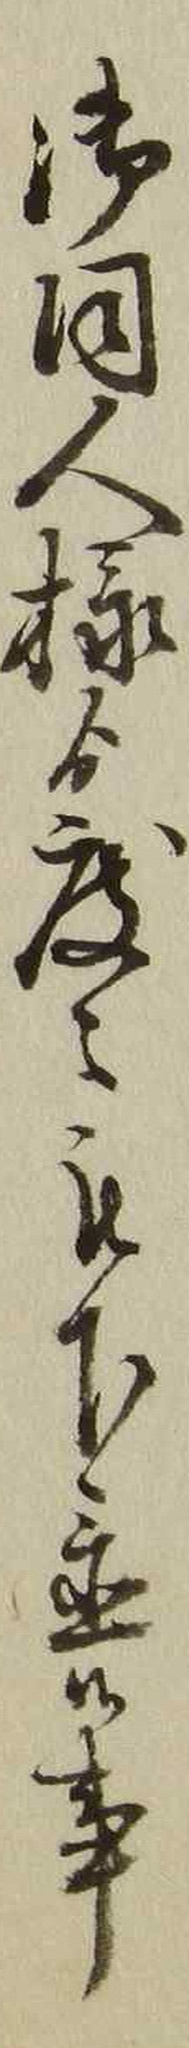御同人様ゟ度々被下置候事
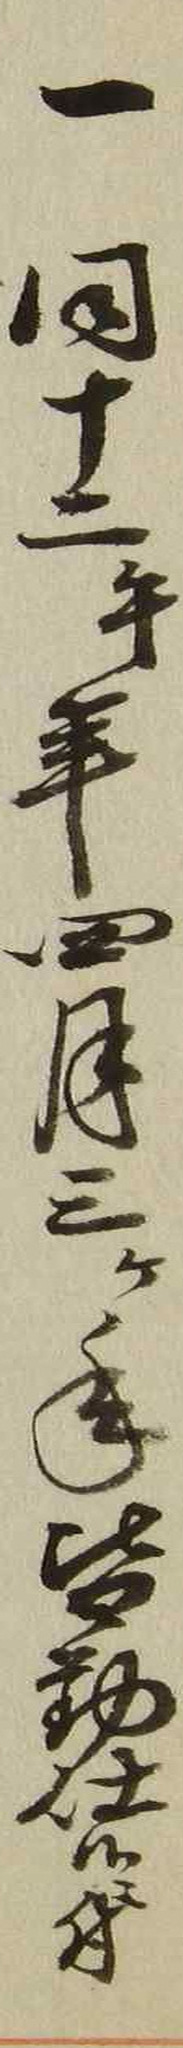一同十二午年四月三ケ年皆勤仕候ニ付
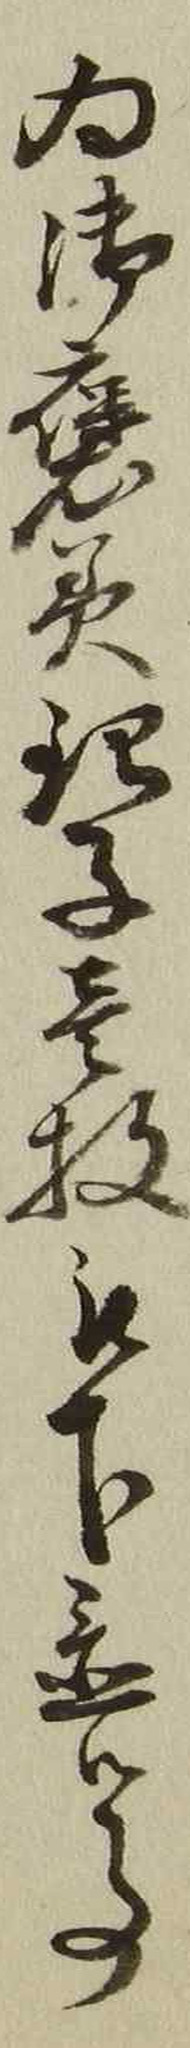為御褒美銀子壱枚被下置候事
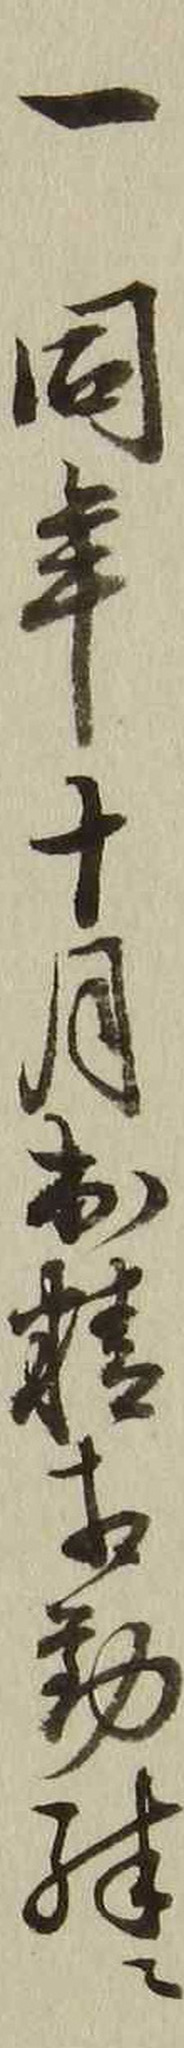一同年十月出精相勤殊ニ
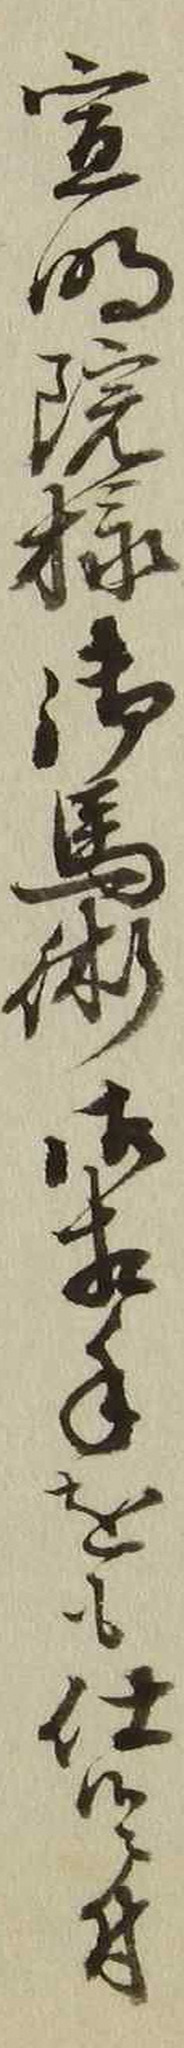宣明院様御馬術御相手をも仕候ニ付
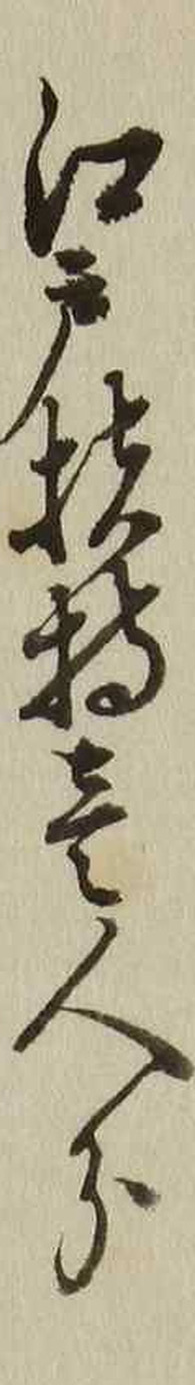江戸扶持壱人分
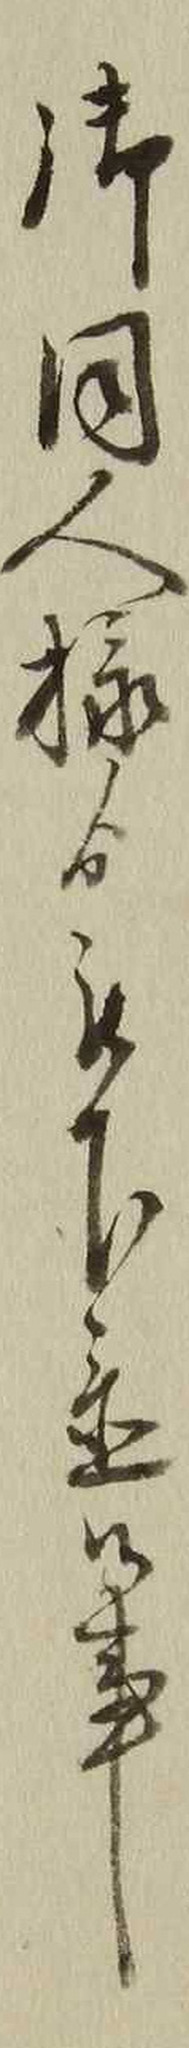御同人様ゟ被下置候事
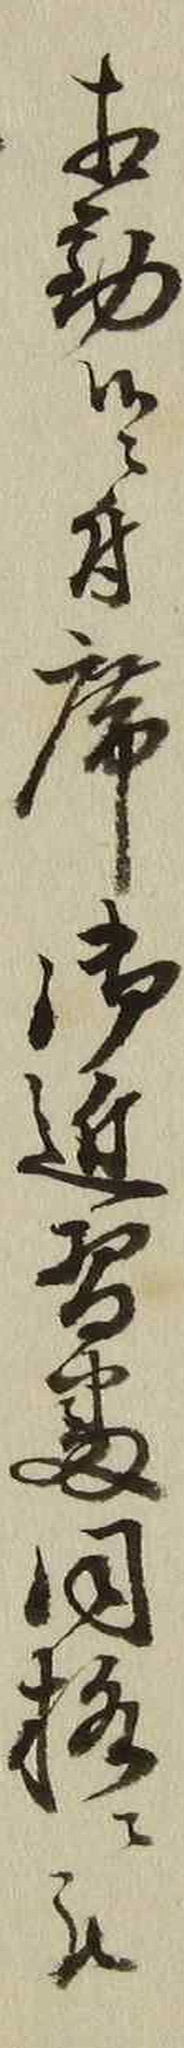相勤候ニ付席御近習番同様ニ被
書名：諸士系譜　巻之31　い之部31
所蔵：会津若松市立会津図書館
